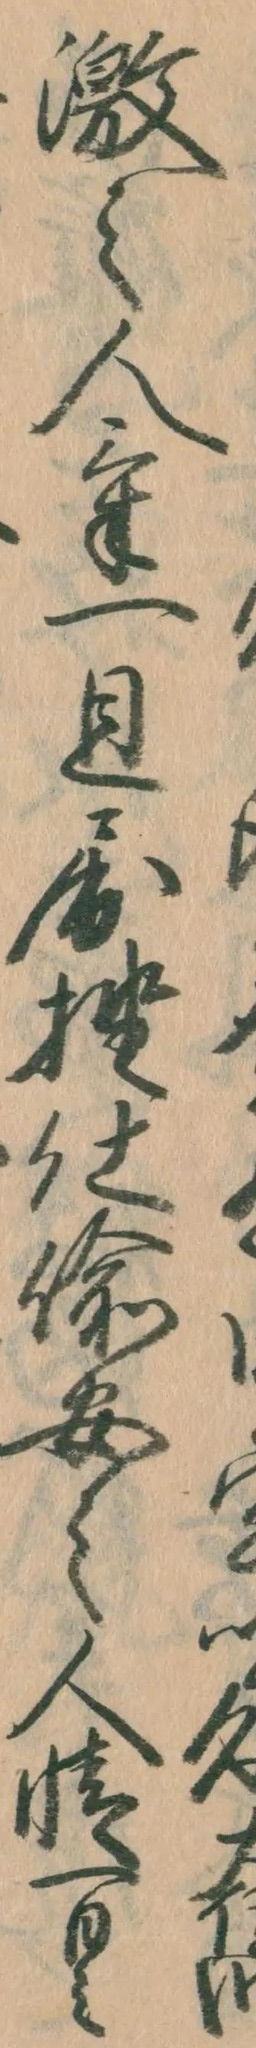激之人氣一且屈挫仕偸安之人情一日之
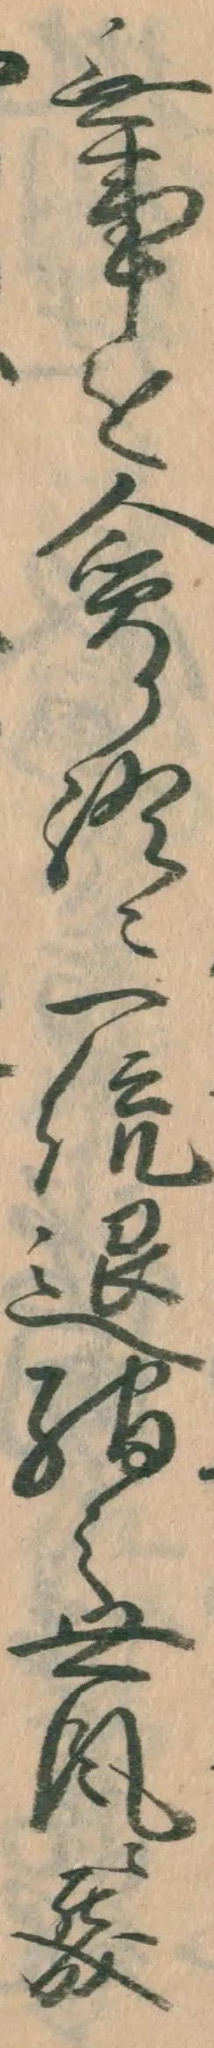無事を貪り終ニ一統退縮之世風ニ罷成
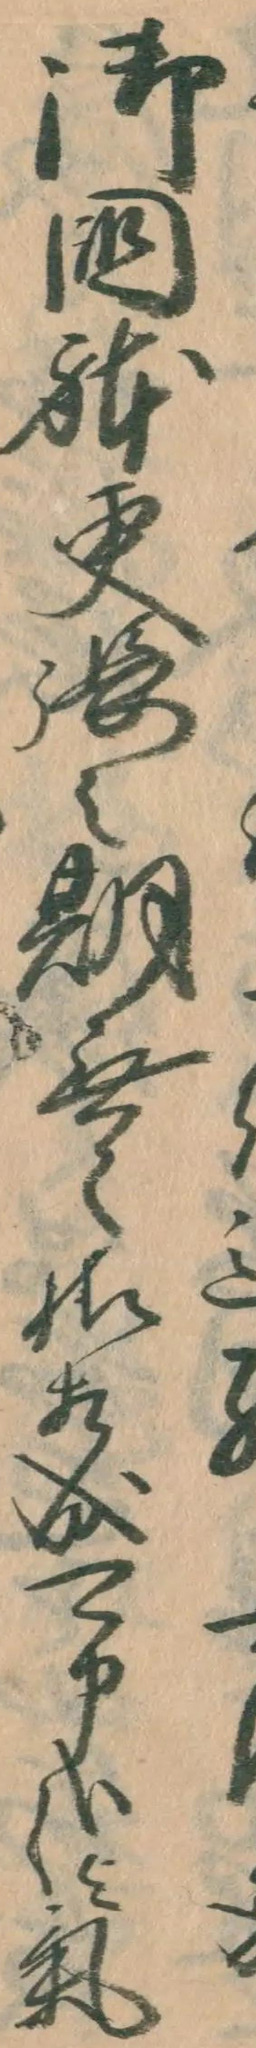御国躰更張之期無之様相成可申哉と氣
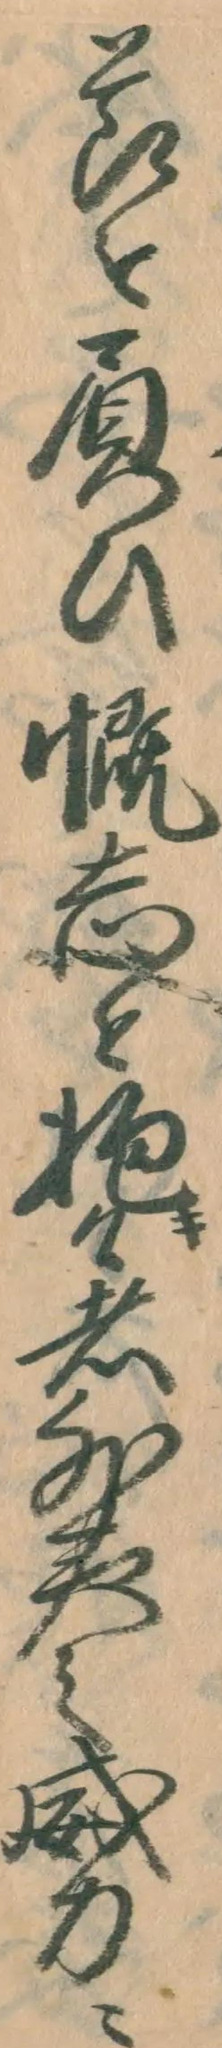節を負ひ慨志を抱き候者外夷之威力ニ

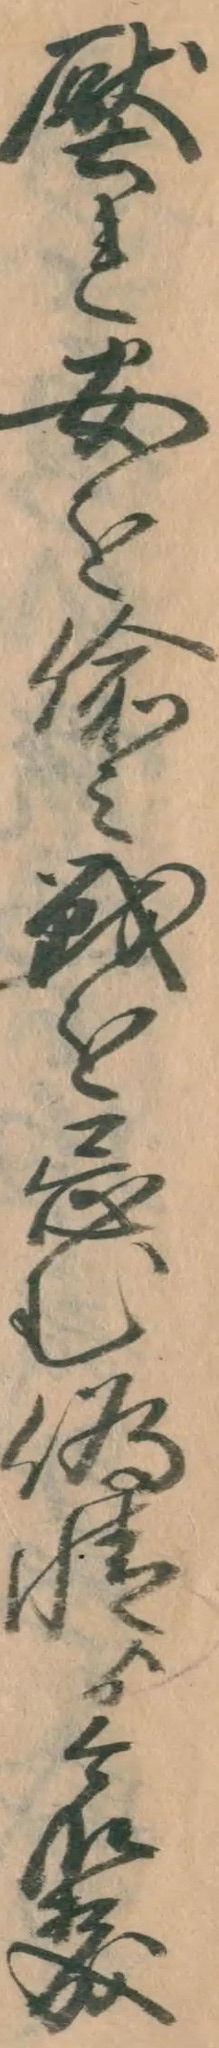圧れ安を偸み戦を忌む偽情より今以相成
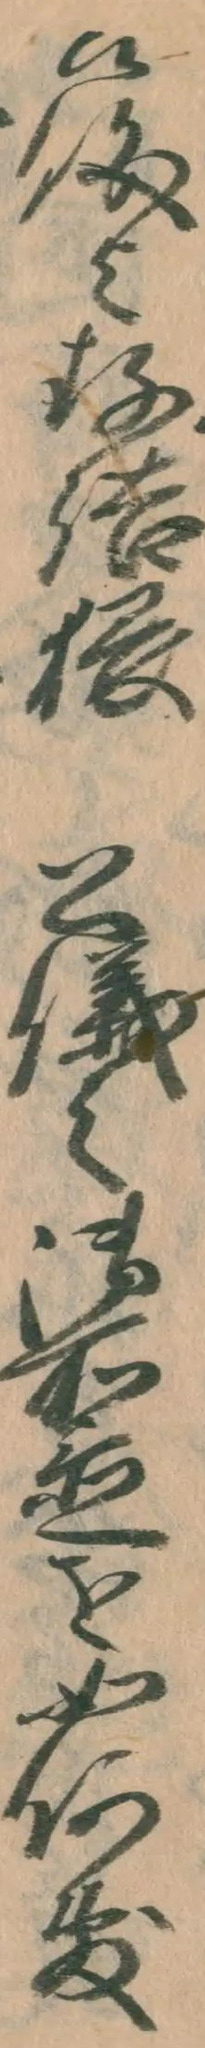候儀と存詰猥公儀之御所置を如何敷
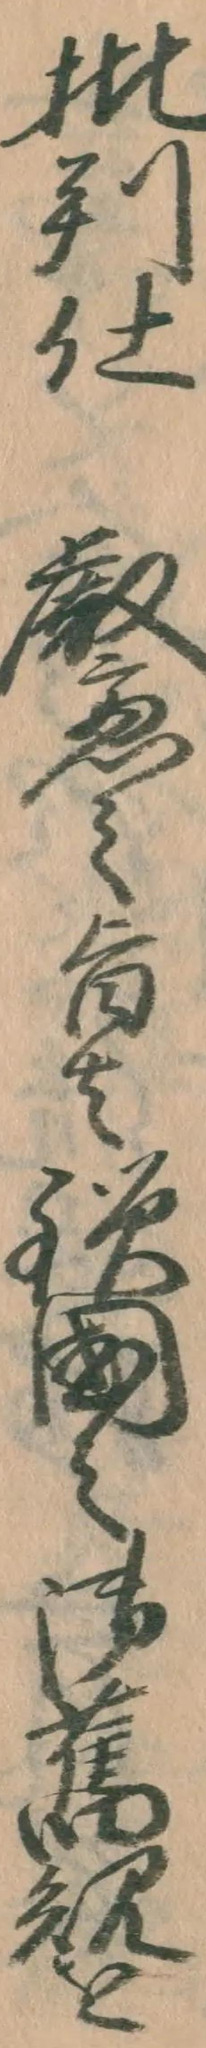批判仕叡慮之旨は鎖国之御舊規を
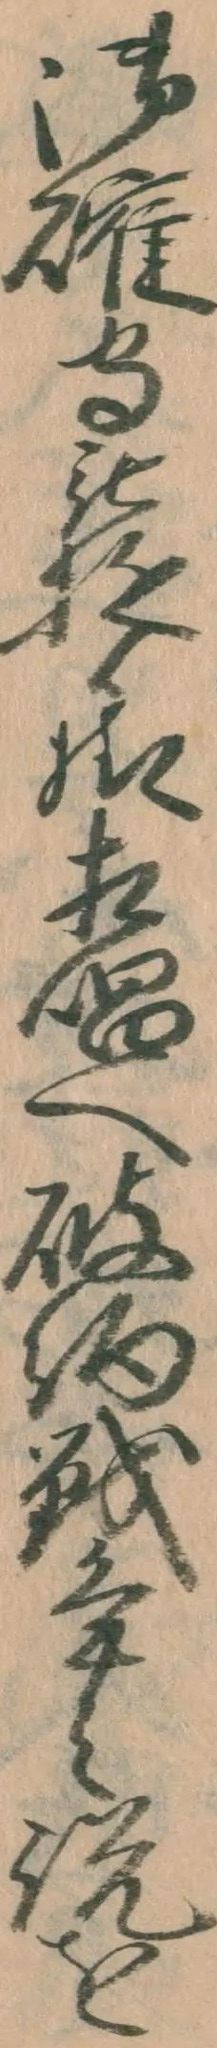御確守被遊候様相唱へ破約戦争之説を
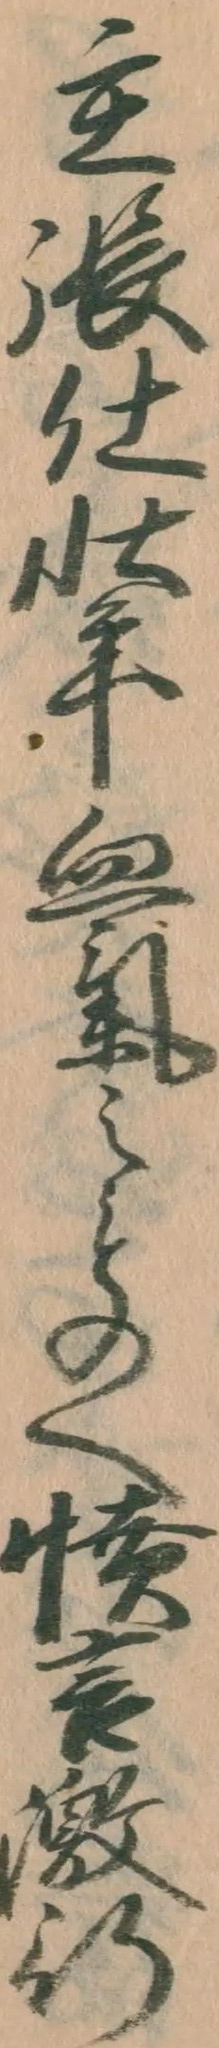主張仕壮年血氣之ものへ憤言激行
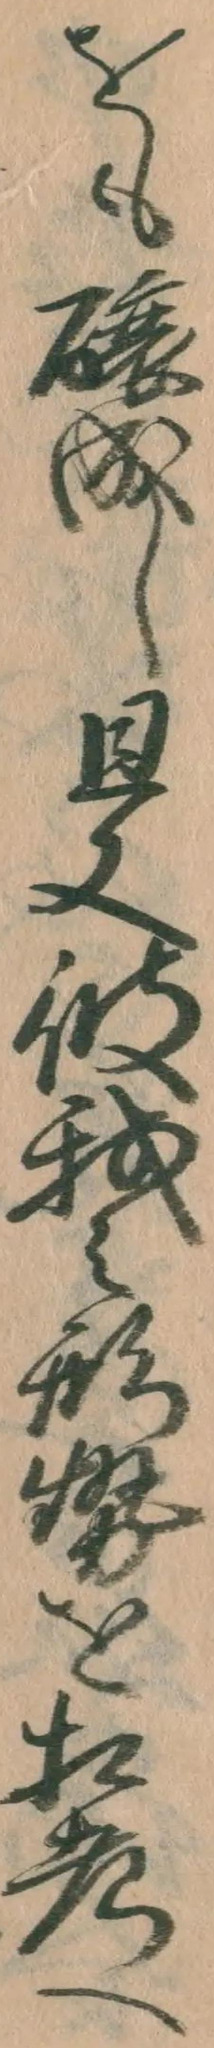をも醸成し且又彼我之形勢を相考へ
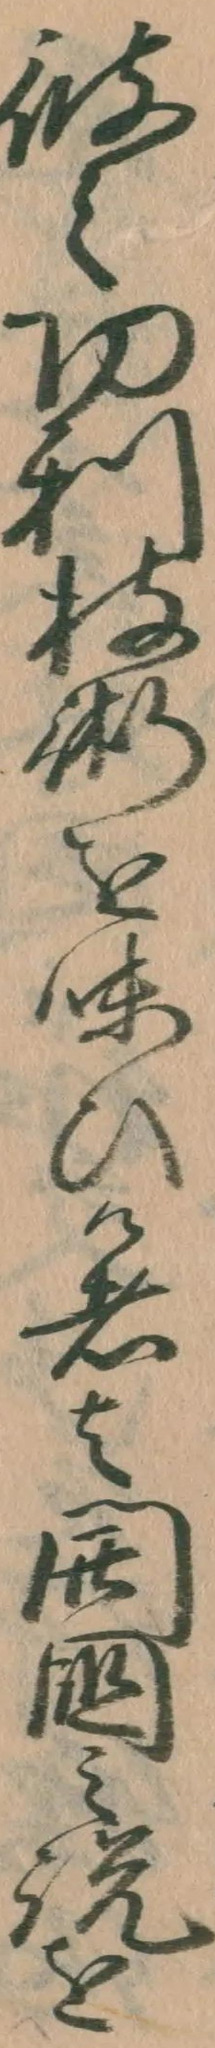彼之功利技術を味ひ候者は開国之説を
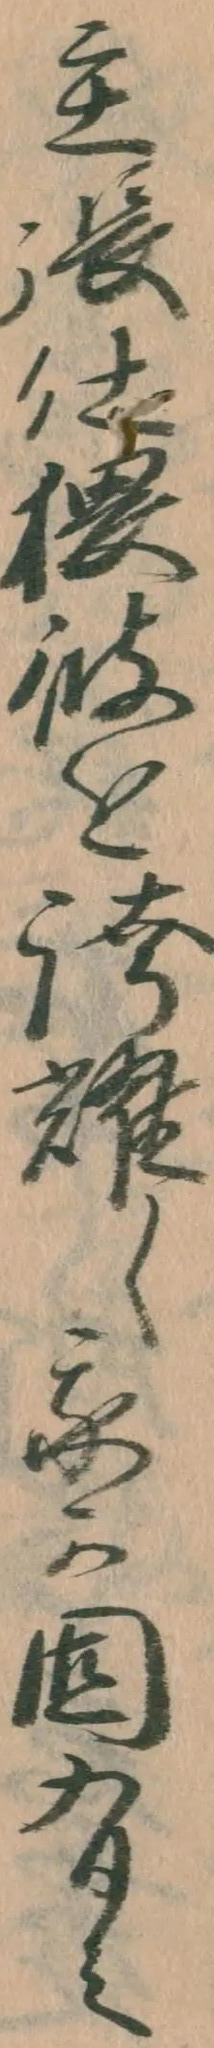主張仕猥彼を誇耀し我か固有之
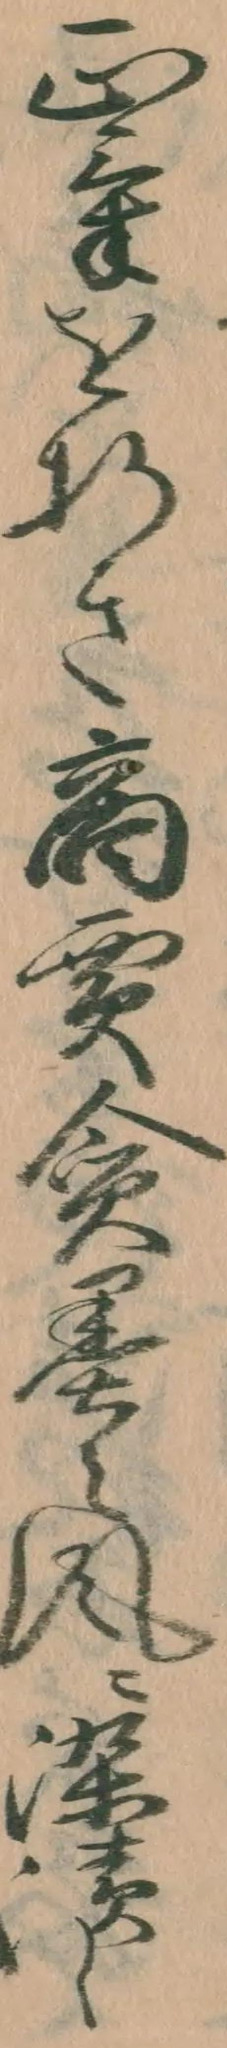正氣を折き商賣貪墨之風ニ染漬候
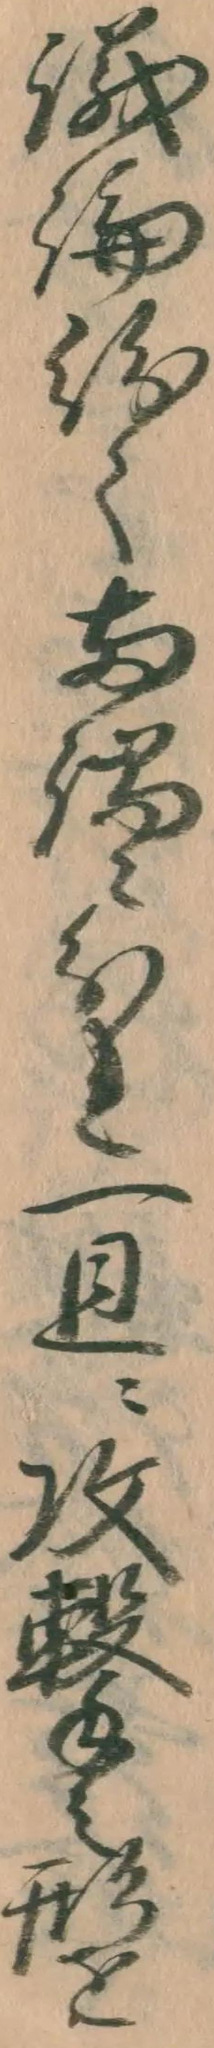議論紛々両端ニ分れ一旦ニ攻撃之形を
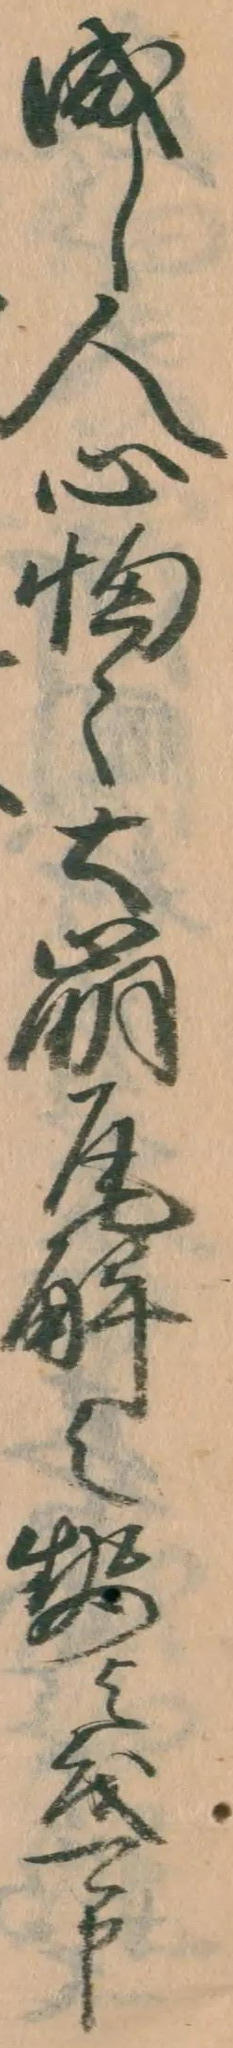成し人心恟々大崩瓦解之勢とも可申
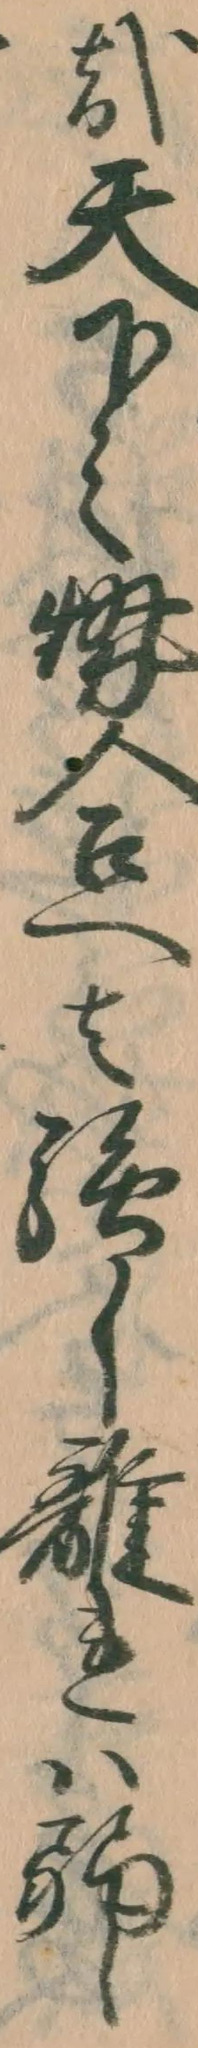哉天下之勢合へは強し離れは弱し
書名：麗斎叢書. 20
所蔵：国立国会図書館 National Diet Library, JAPAN
